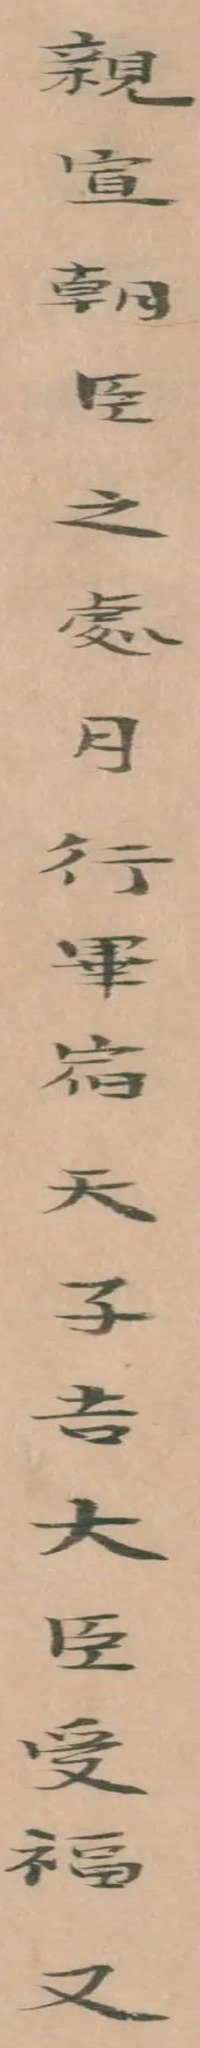親宜朝臣之処月行畢宿天子𠮷大臣受福又
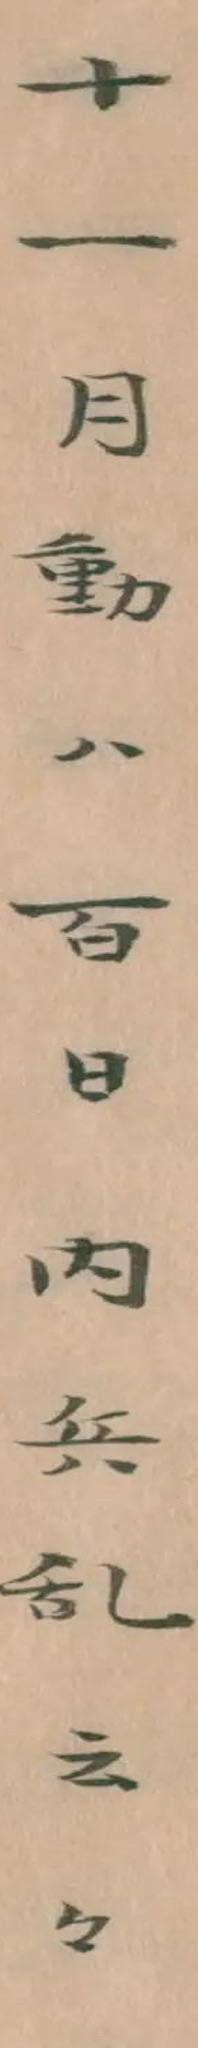十一月動ハ百日内兵乱云々
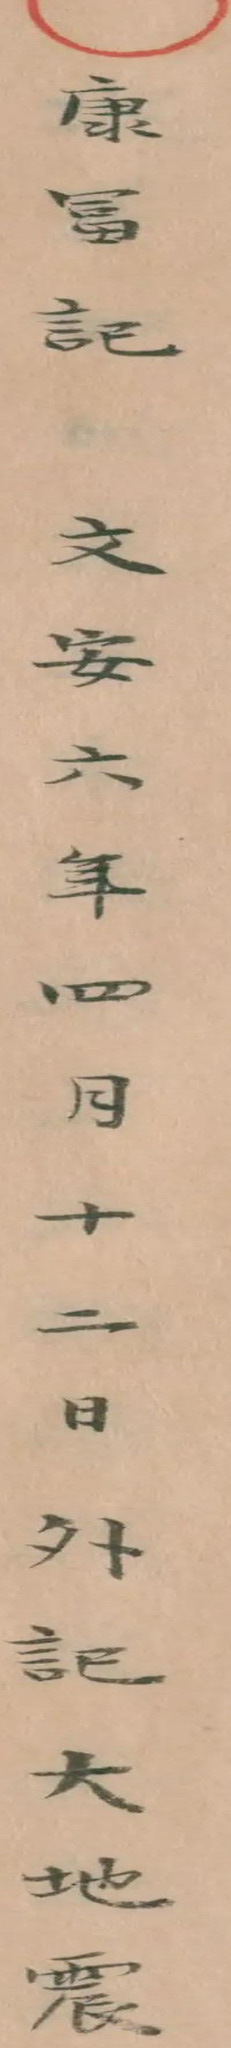○康富記文安六年四月十二日外記大地震
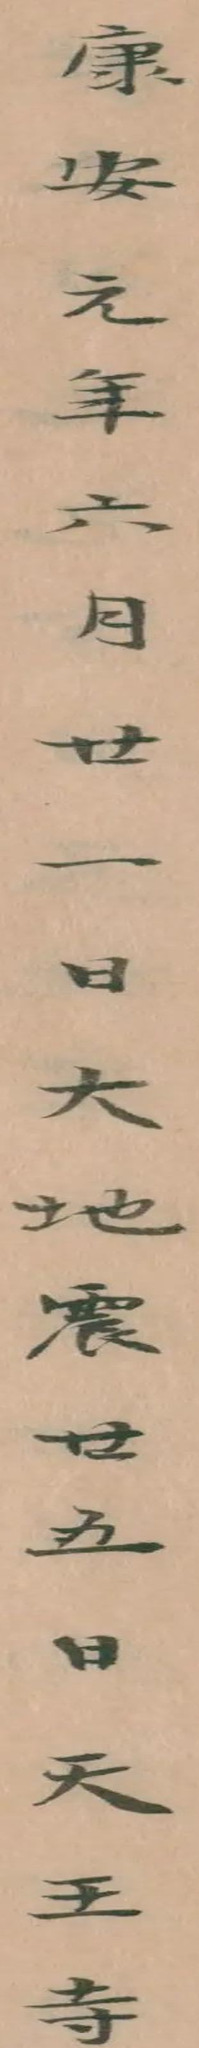康安元年六月廿一日大地震廿五日天王寺
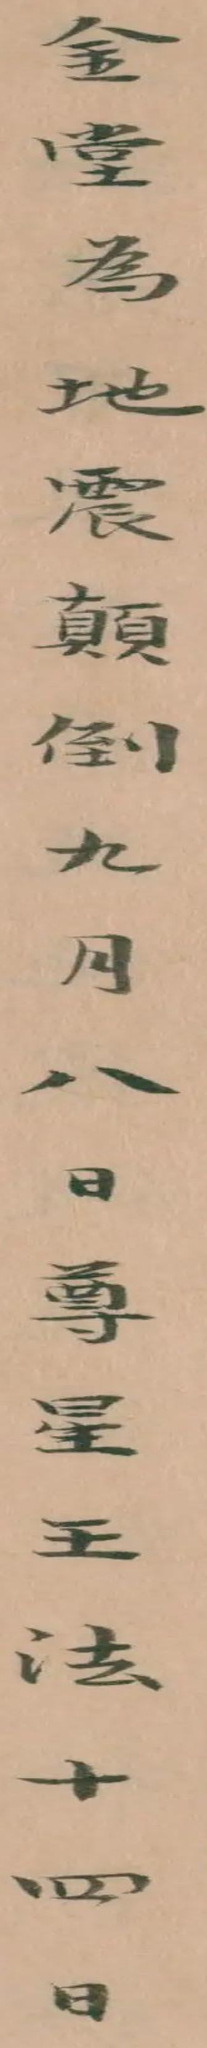金堂為地震顛倒九月八日尊星王法十四日
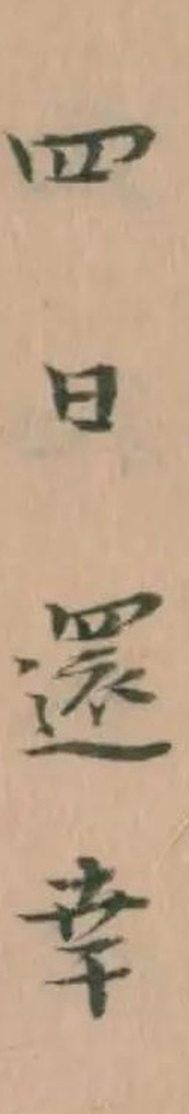四日還幸
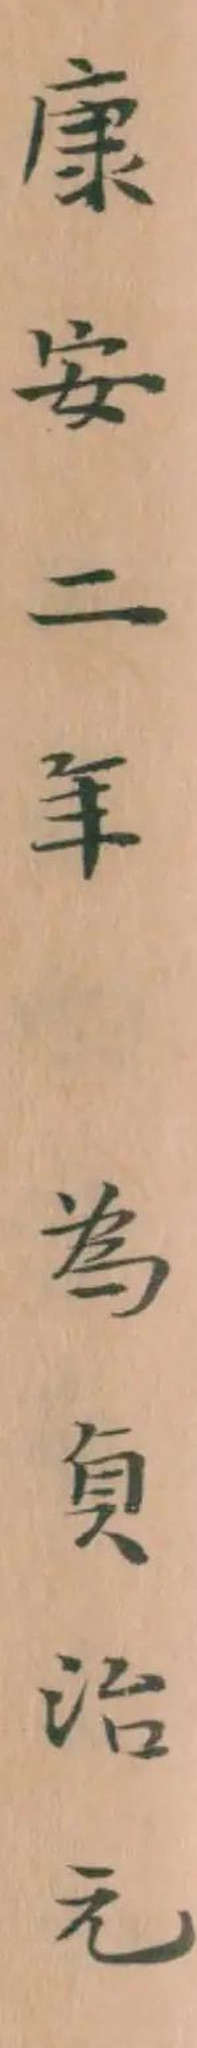康安二年為貞治元
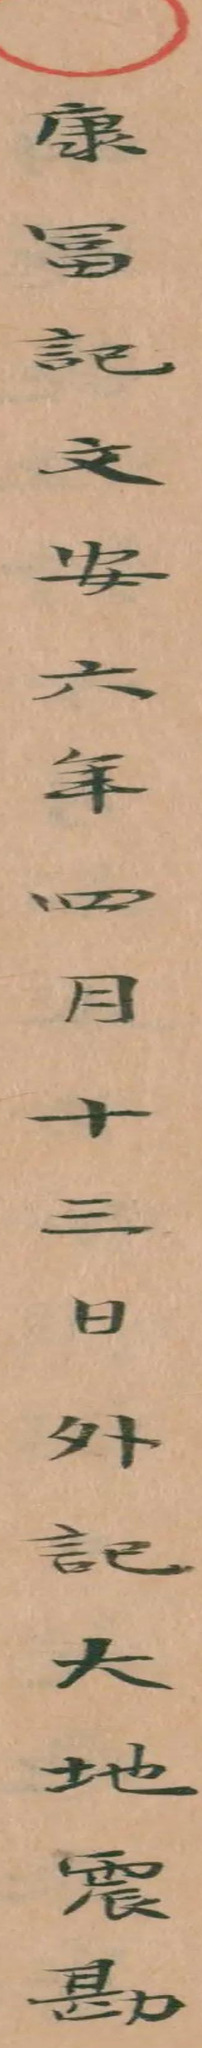○康富記文安六年四月十三日外記大地震勘
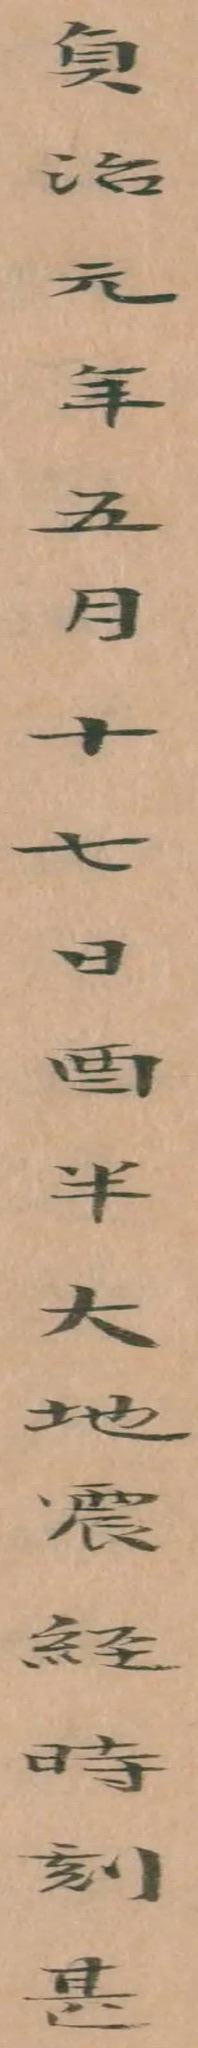貞治元年五月十七日酉半大地震経時刻甚
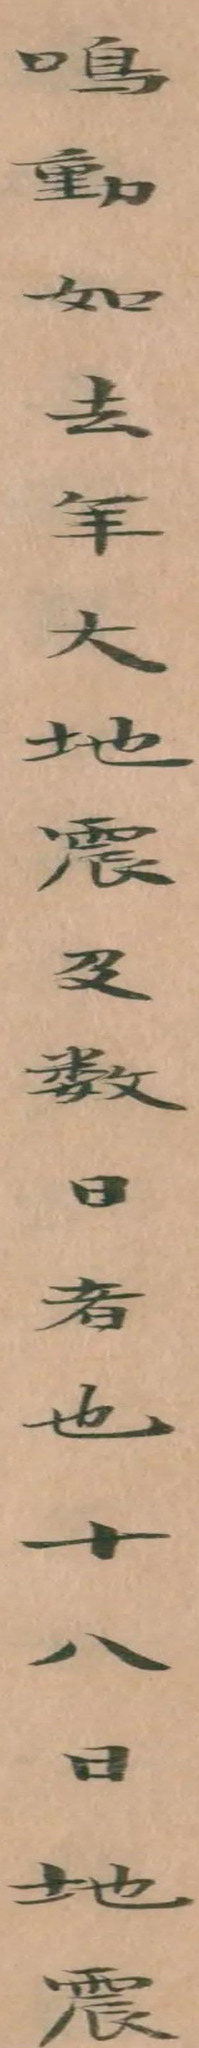鳴動如去年大地震及数日者也十八日地震
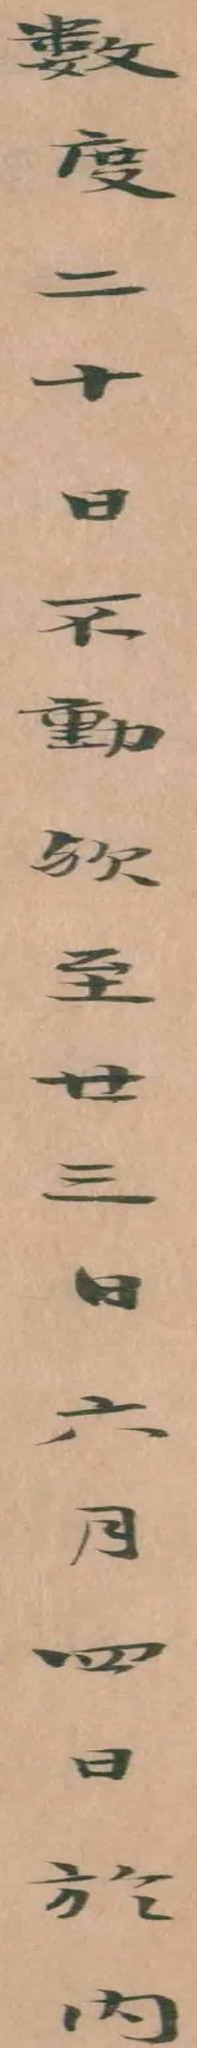数度二十日不動歟至廿三日六月四日於内
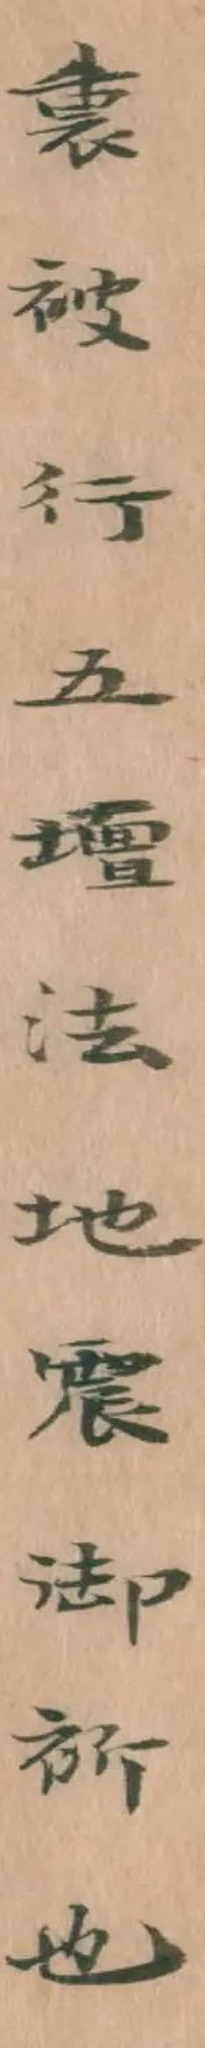裏被行五壇法地震御祈也
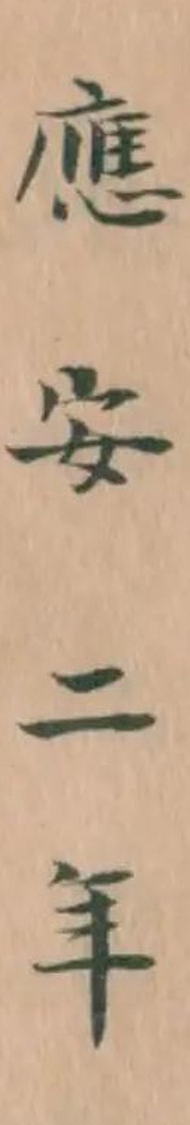応安二年
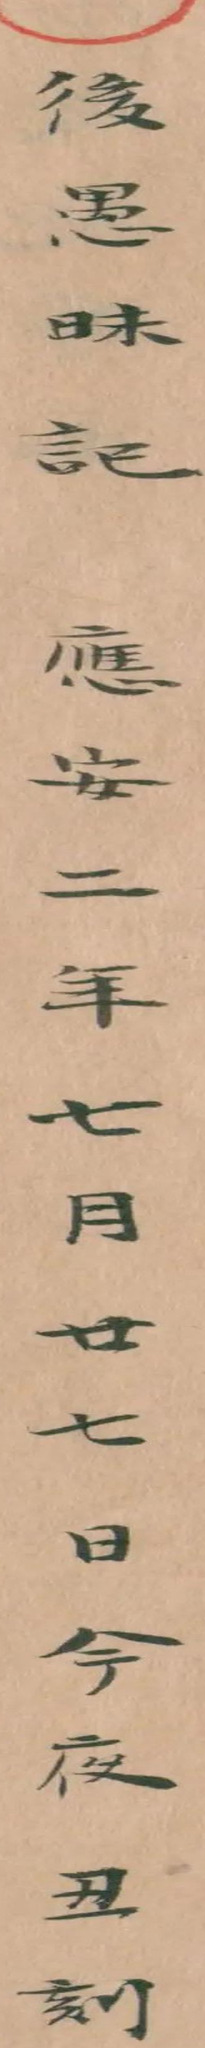○後愚昧記応安二年七月廿七日今夜丑刻
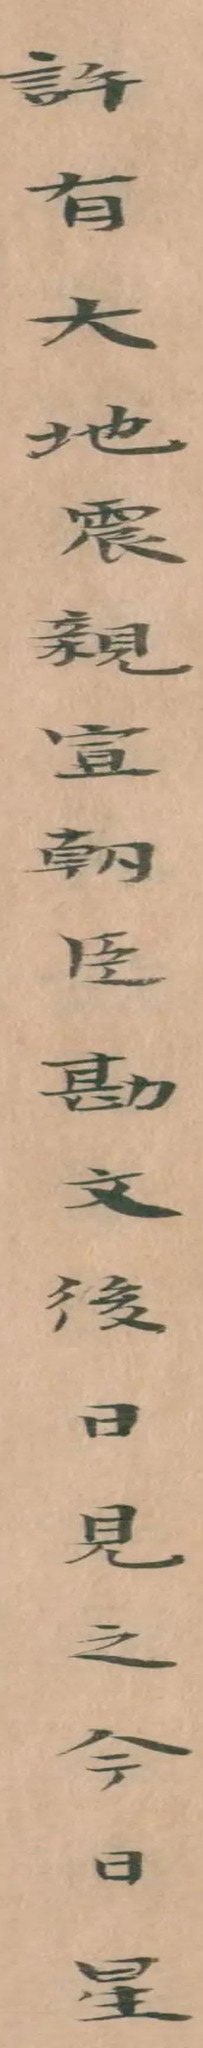許有大地震親宜朝臣勘文後日見之今日星

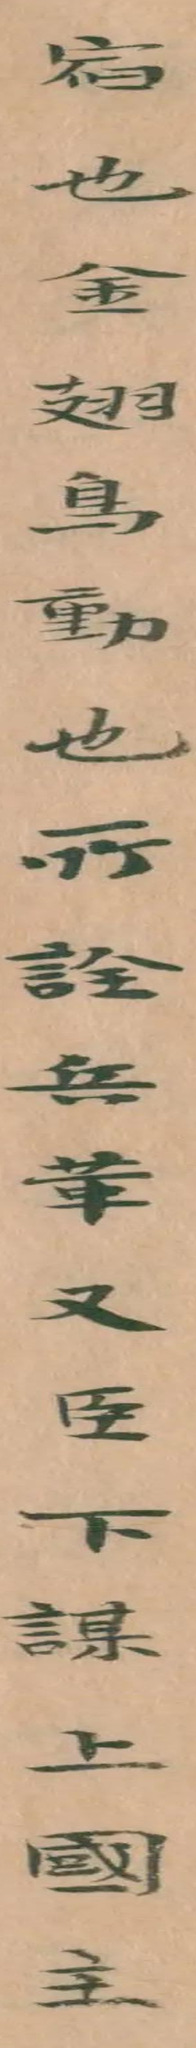宿也金翅鳥動也所詮兵革又臣下謀上国主
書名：地災撮要. 巻5-6(地震之部)
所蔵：国立国会図書館 National Diet Library, JAPAN
